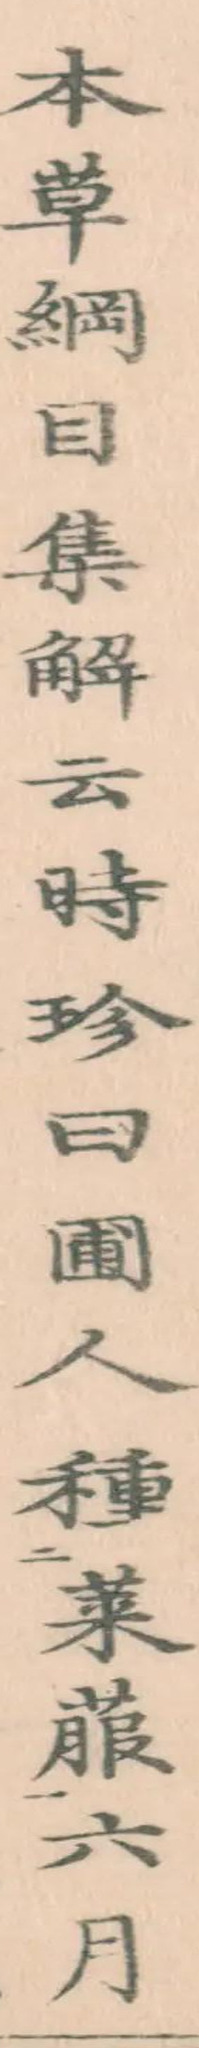本草綱目集解云時珍曰圃人種莱菔六月
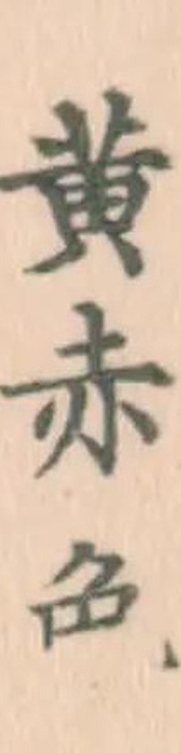黄赤色
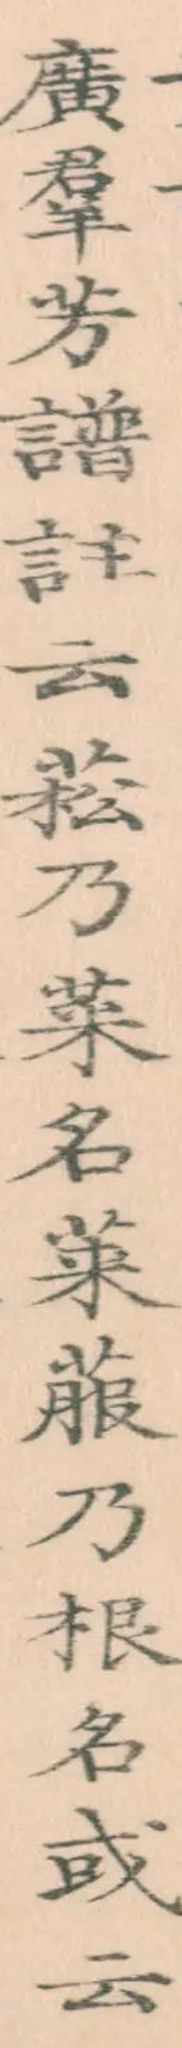廣羣芳譜註云菘乃菜名莱菔乃根名或云

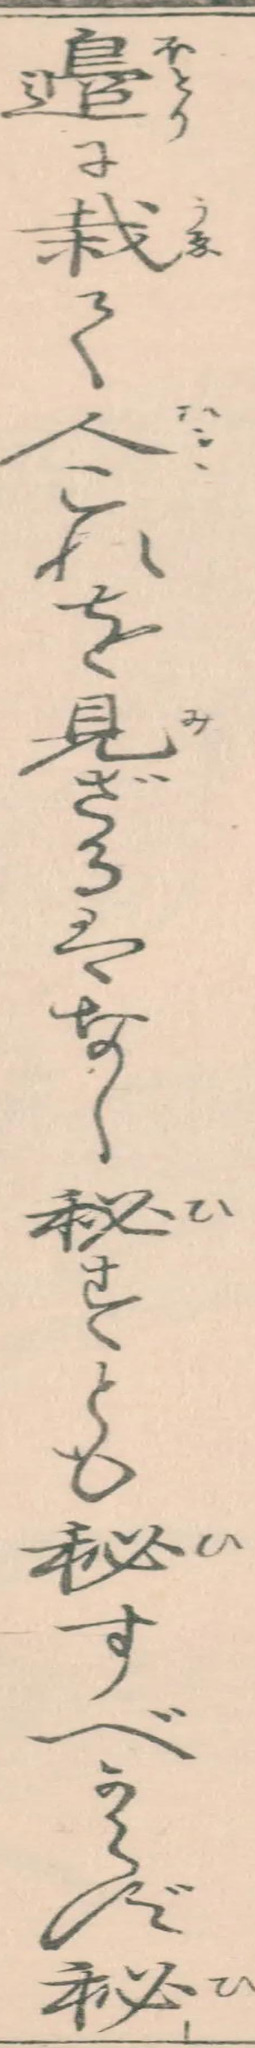辺に栽て人これを見ざるはなし秘すとも秘すべからず秘-
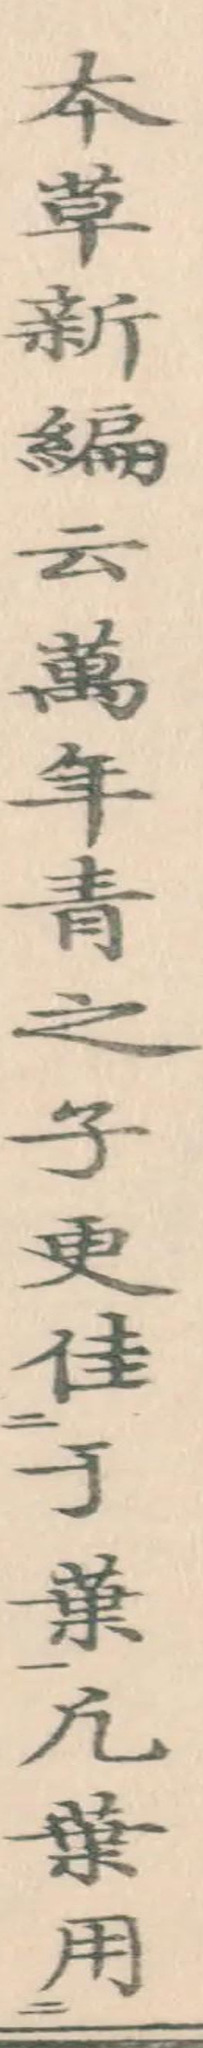本草新編云万年青之子更佳于葉凡葉用

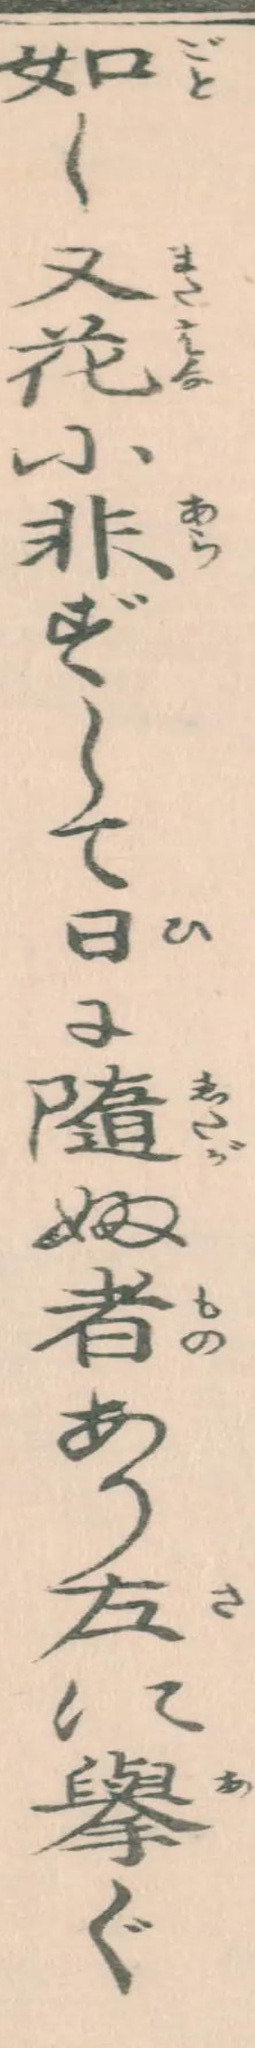如し又花に非ずして日に随ふ者あり左に挙ぐ

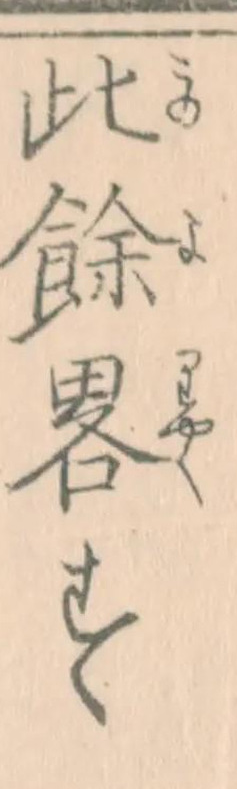此餘略す
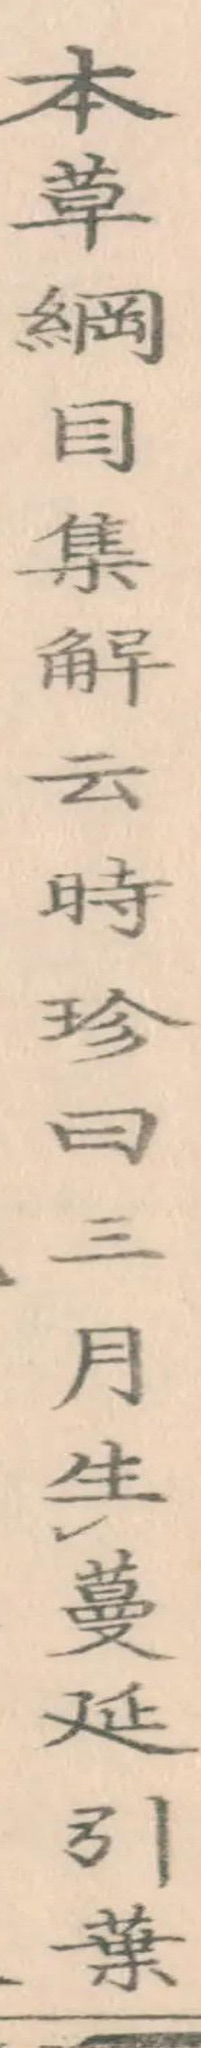本草綱目集解云時珍曰三月生蔓延引葉
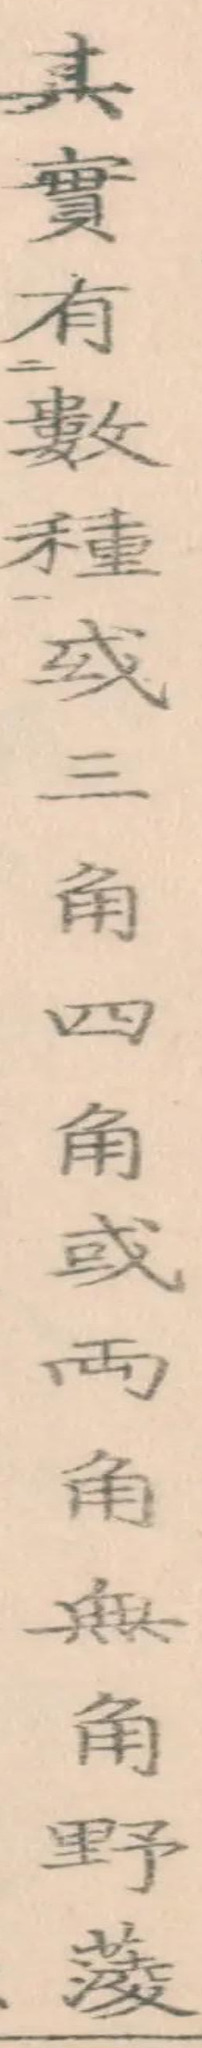其実有数種或三角四角或両角無角野蔆
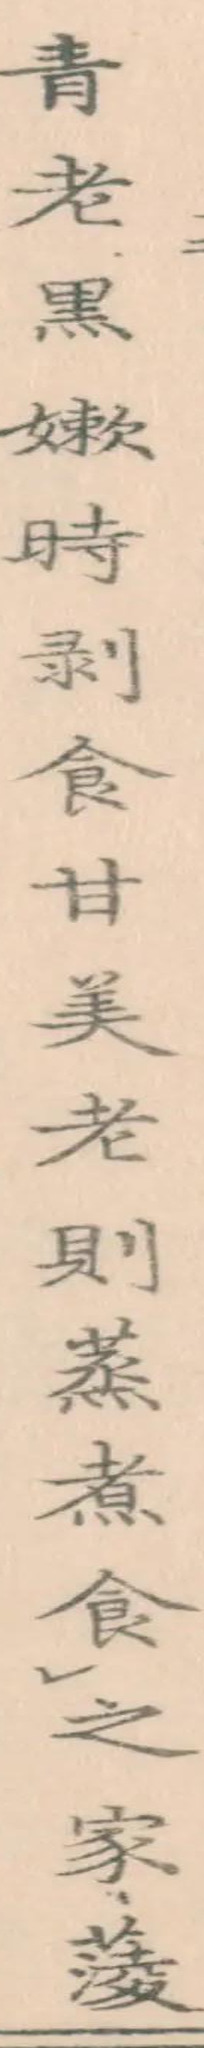青老黒嫩時剥食甘美老則蒸煮食之家蔆
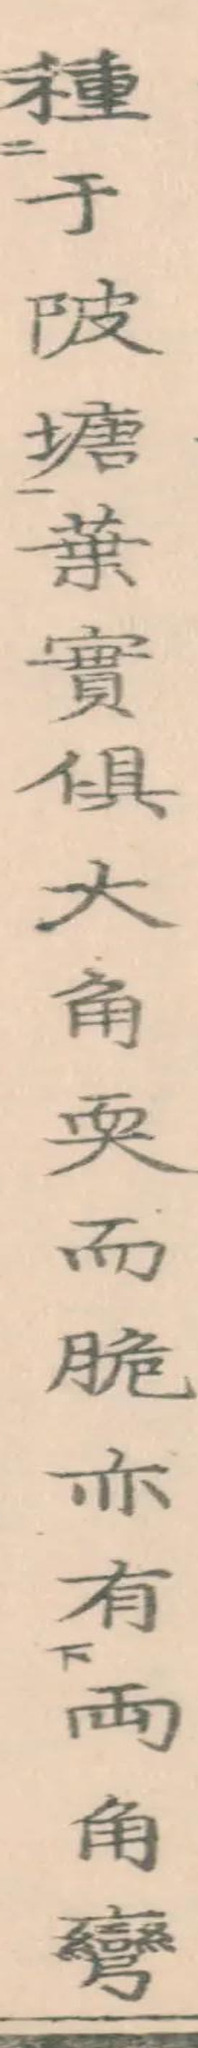種于陂塘葉実倶大角耎而脆亦有両角彎

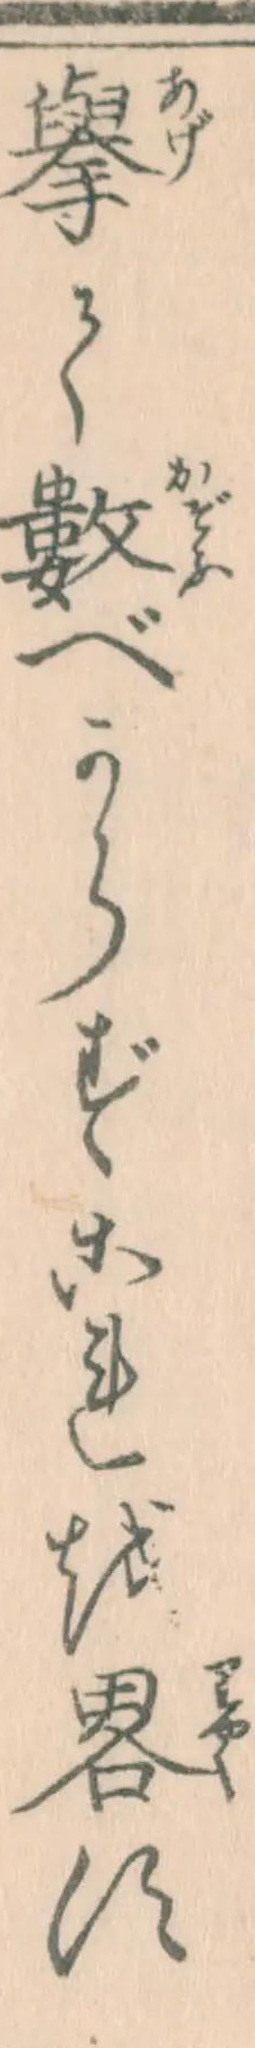挙て数べからずこれを略す
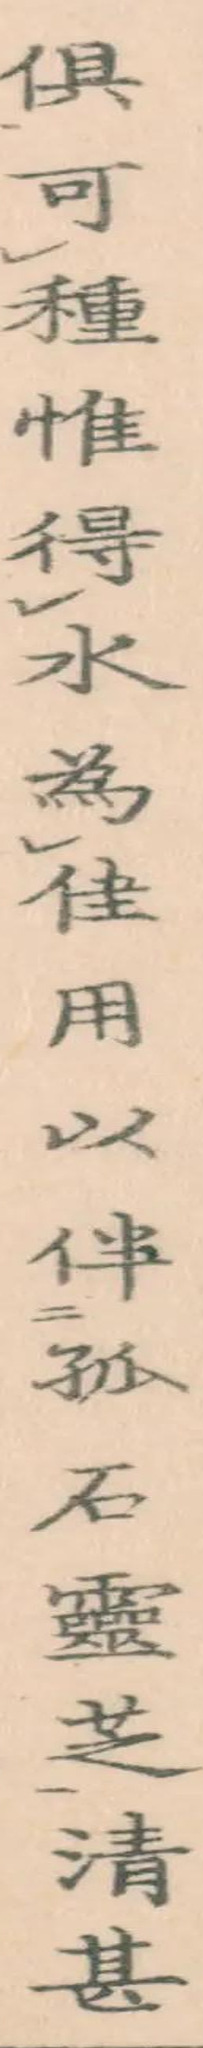俱可種惟得水為佳用以伴孤石霊芝清甚
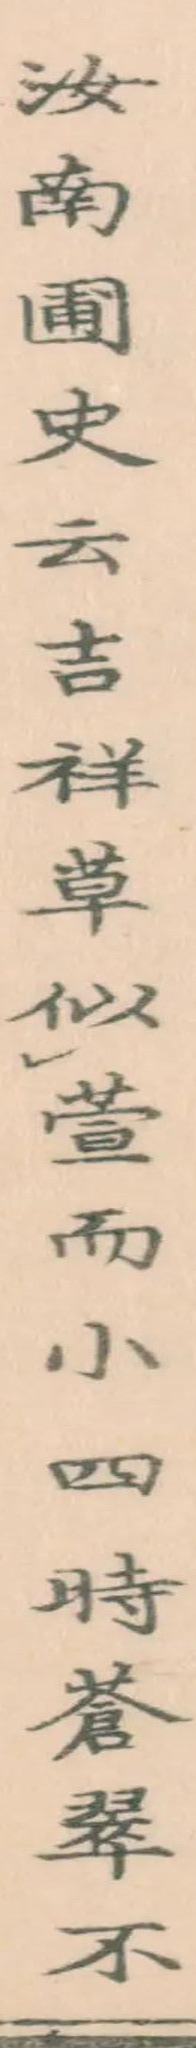汝南圃史云吉祥草似萱而小四時蒼翠不

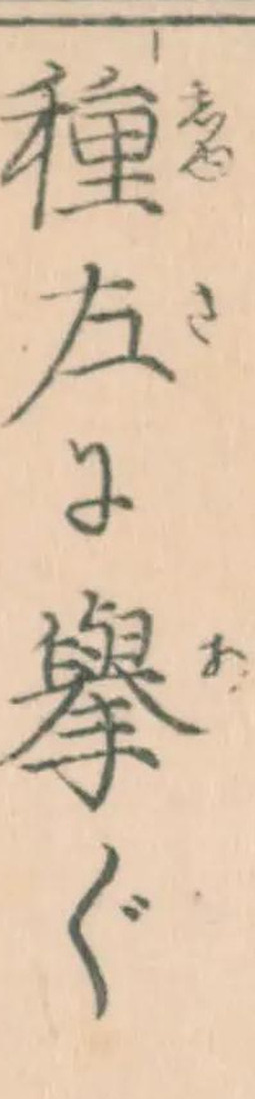-種左に挙ぐ
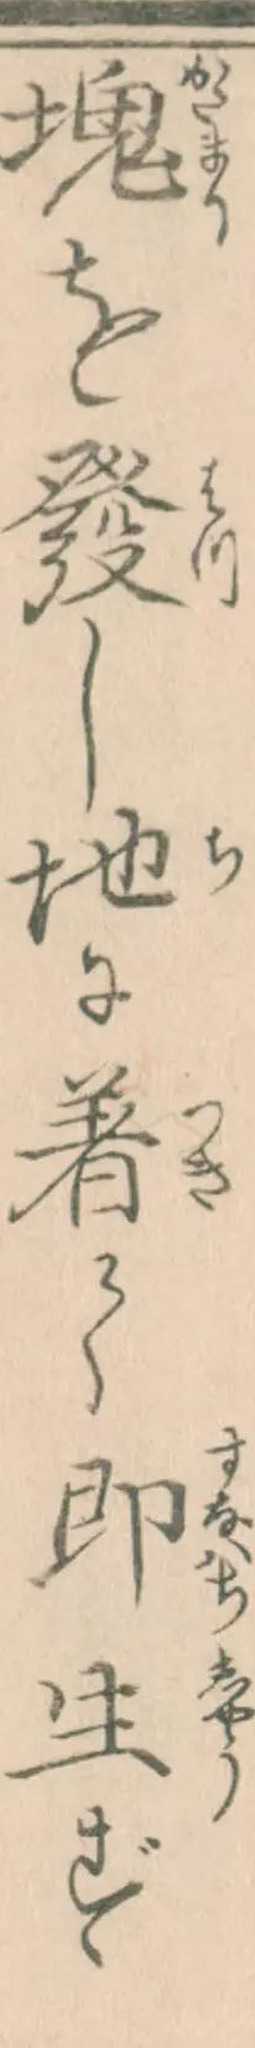塊を発し地に着て即生ず
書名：草木性譜 3巻. [2]
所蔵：国立国会図書館 National Diet Library, JAPAN
